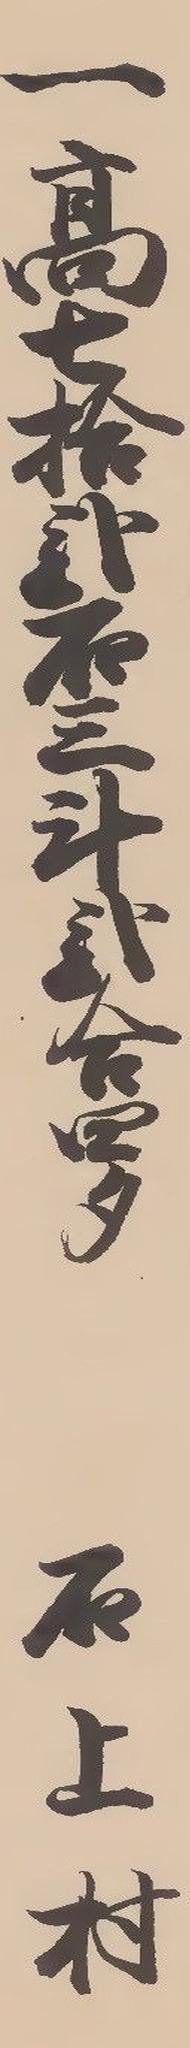一高七拾弐石三斗弐合四勺石上村
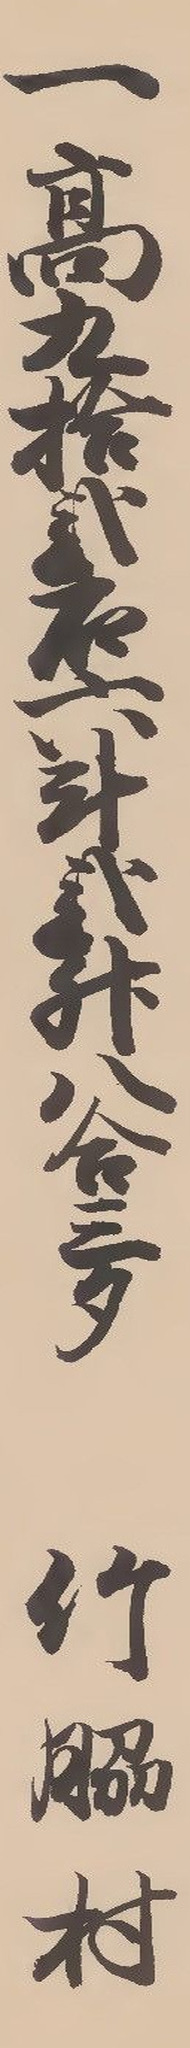一高九拾弐石六斗弐升八合三勺竹脇村
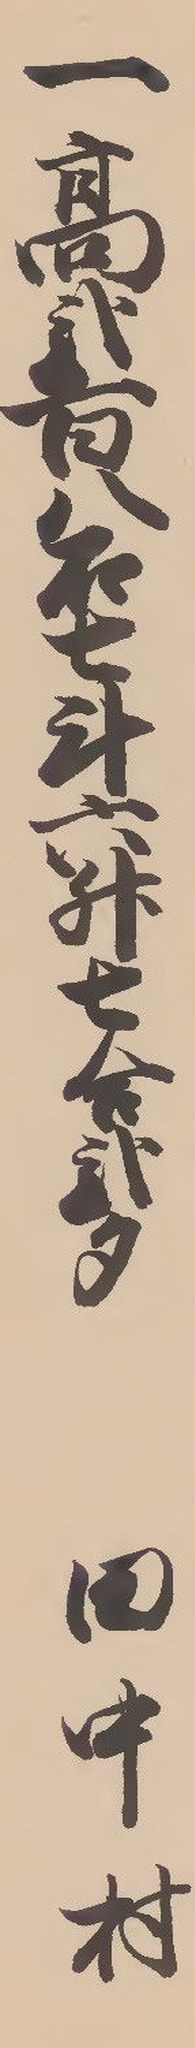一高弐百八石七斗六升七合弐勺田中村

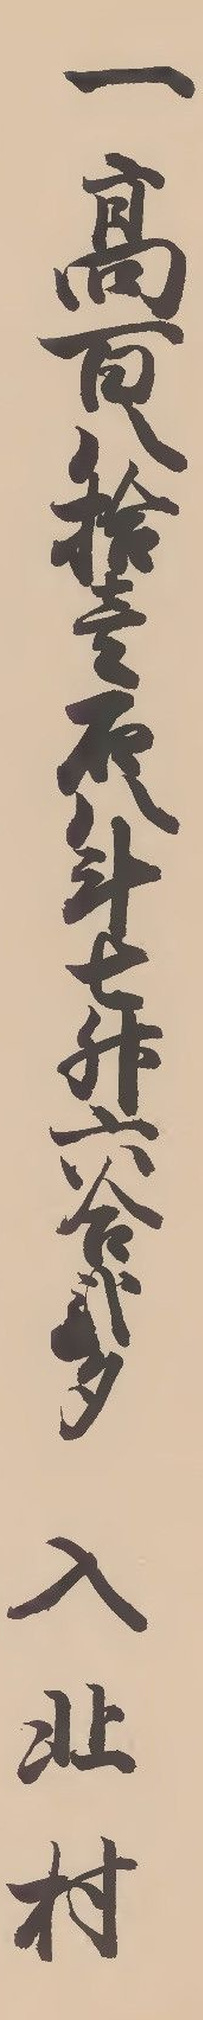一高百八拾壱石八斗七升六合弐勺入北村
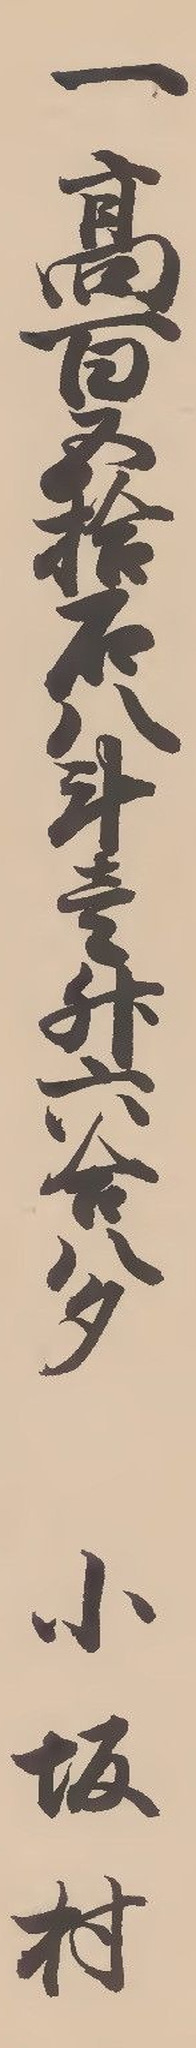一高百五拾石八斗壱升六合八勺小坂村
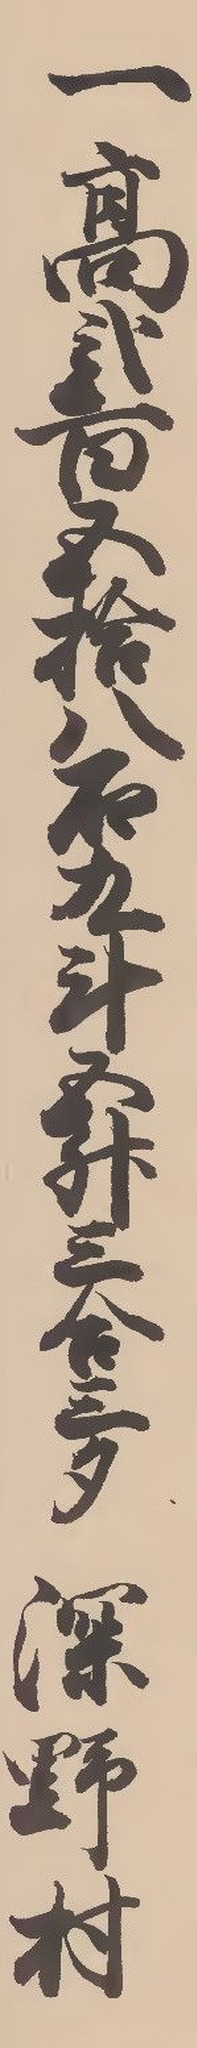一高弐百五拾八石九斗五升三合三勺深野村
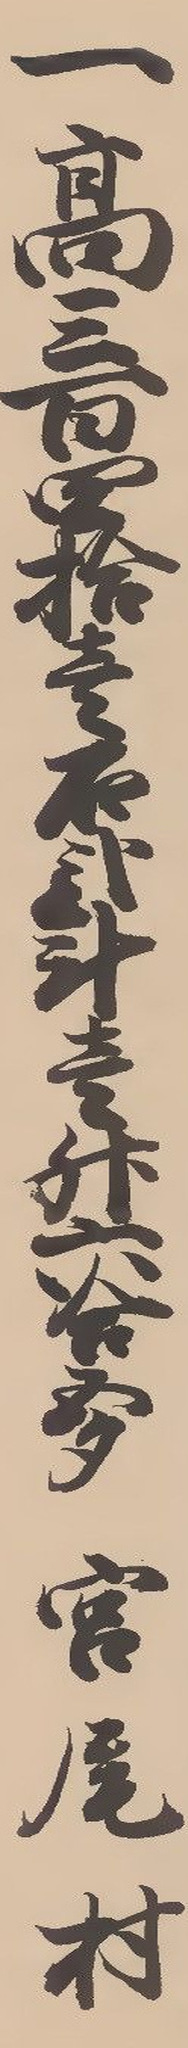一高三百四拾壱石弐斗壱升六合五勺宮尾村
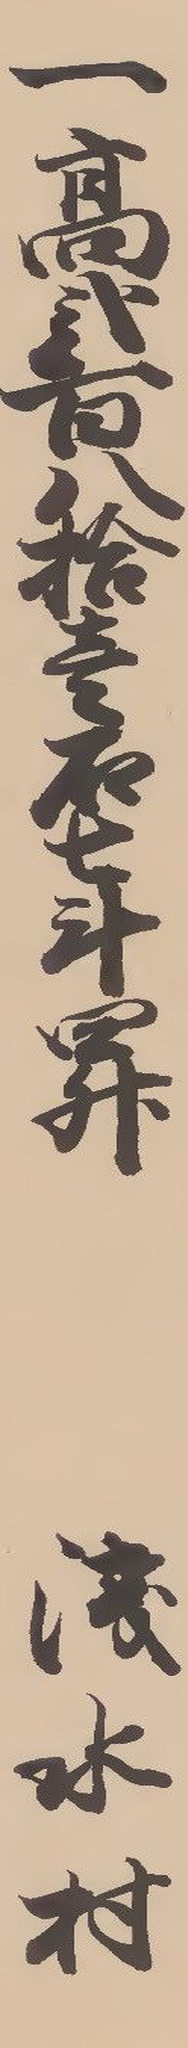一高弐百八拾壱石七斗四升浅水村
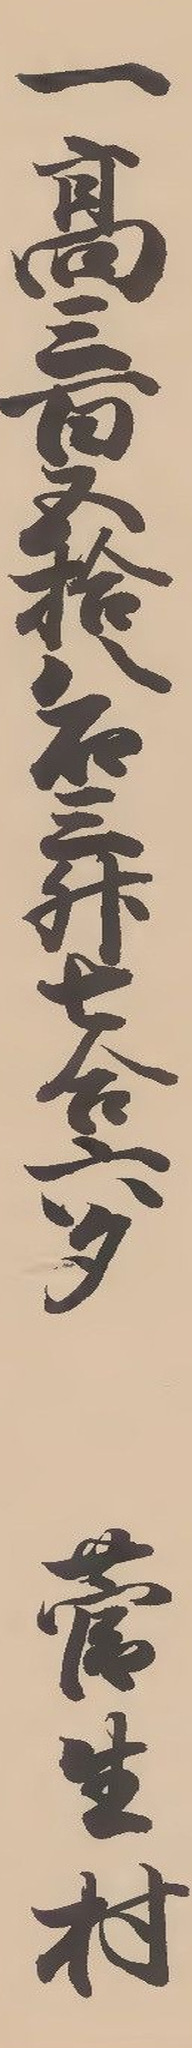一高三百五拾八石三升七合六勺菅生村
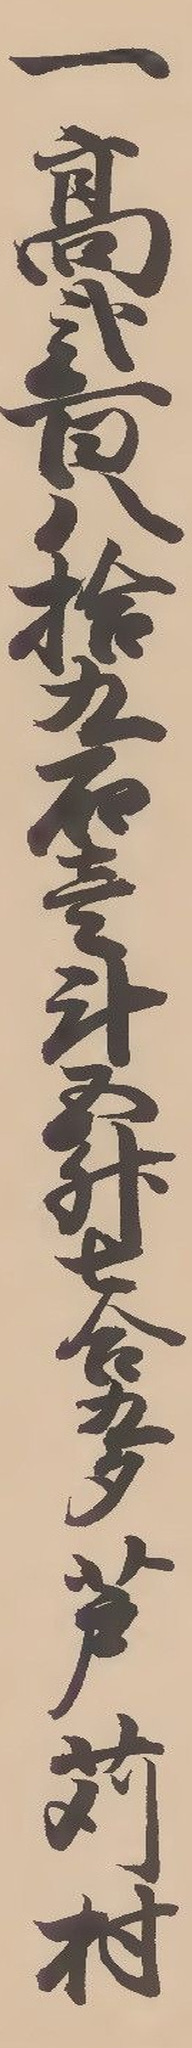一高弐百八拾九石壱斗五升七合九勺芦苅村

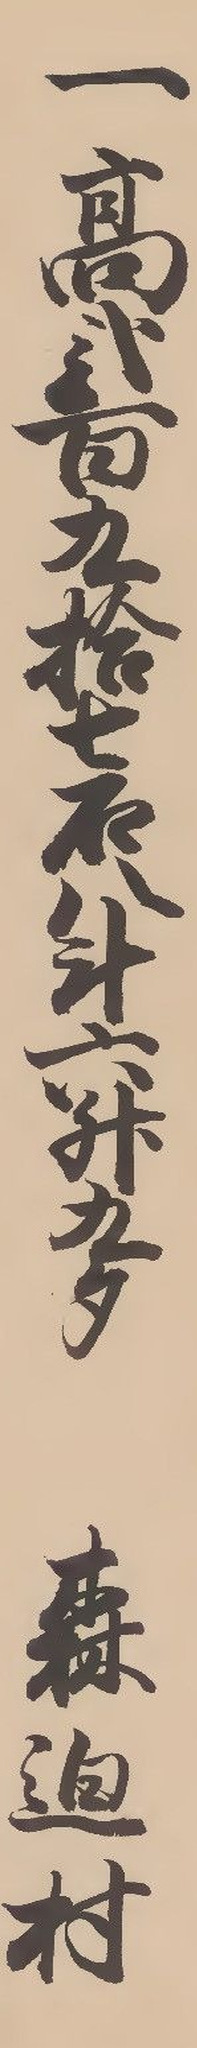一高弐百九拾七石八斗六升九勺森迫村
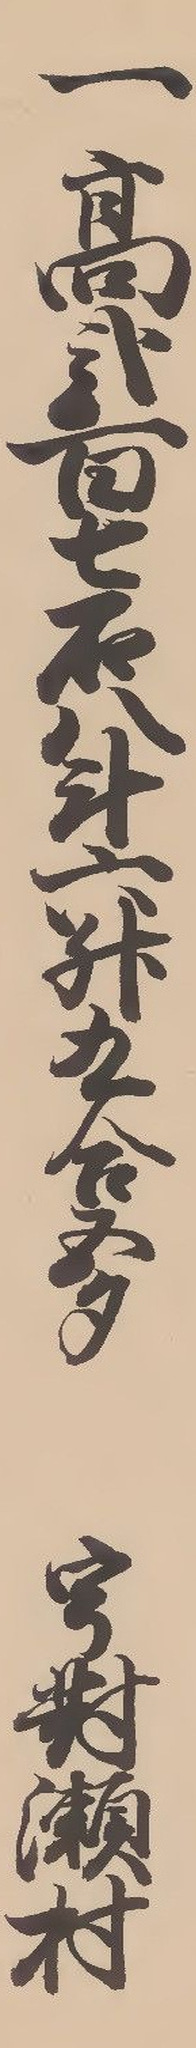一高弐百七石八斗六升九合五勺宇対瀬村
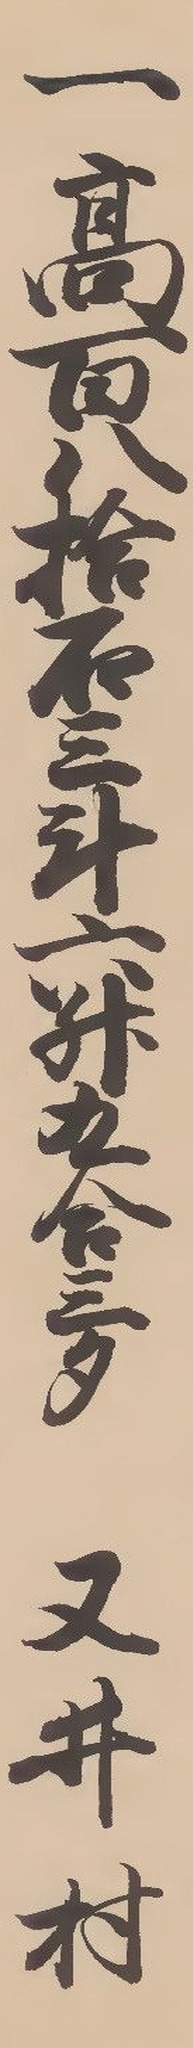一高百八拾石三斗六升九合三勺又井村
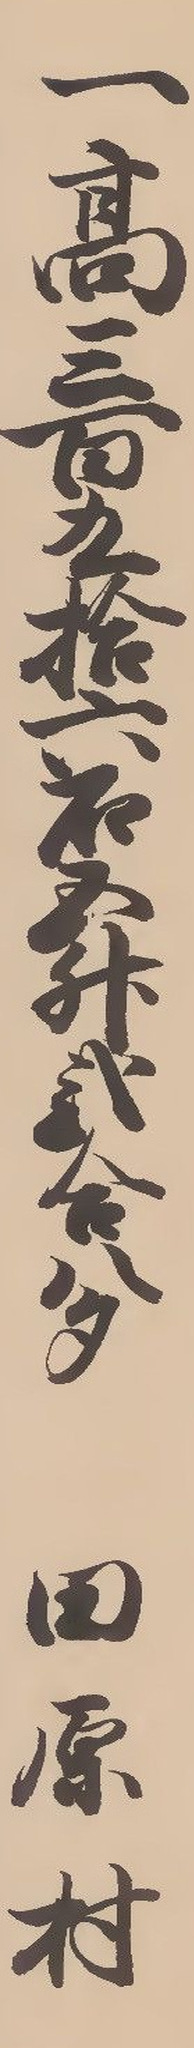一高三百九拾六石五升弐合八勺田原村
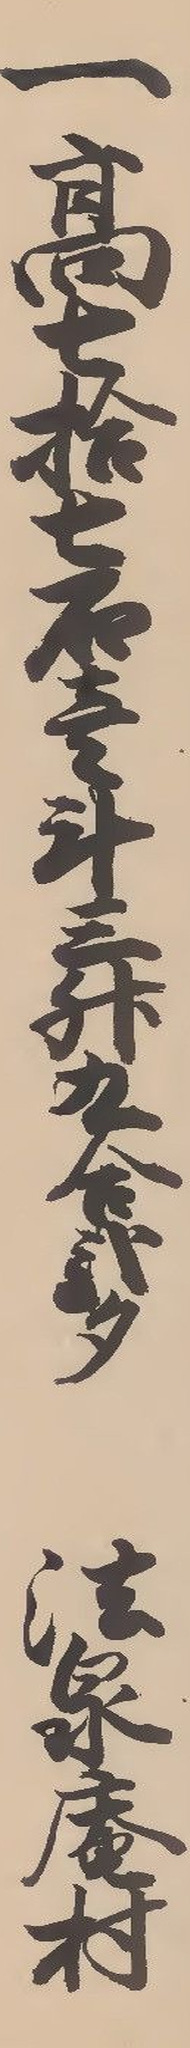一高七拾七石壱斗三升九合弐勺法泉庵村
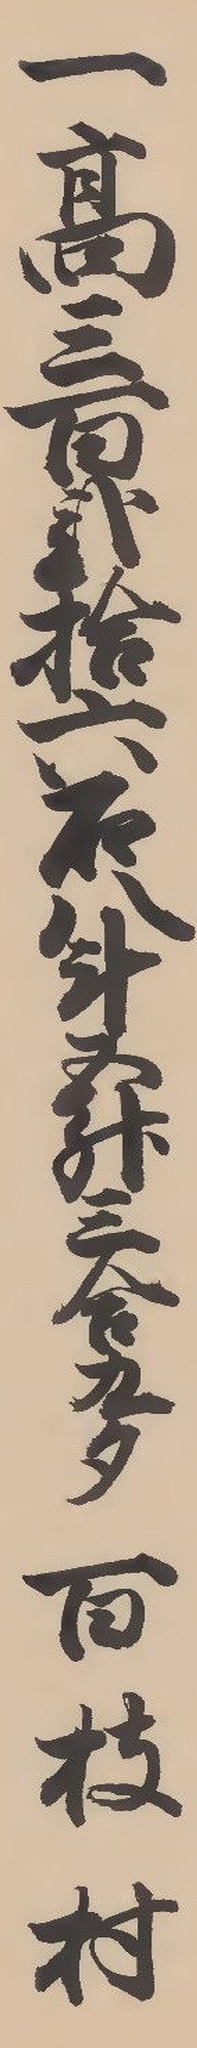一高三百弐拾六石八斗五升三合九勺百枝村
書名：豊後国郷帳
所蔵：国立公文書館 National Archives of Japan
